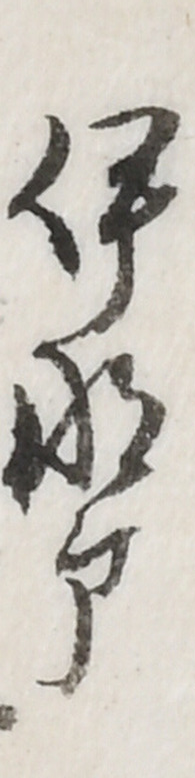伊那部
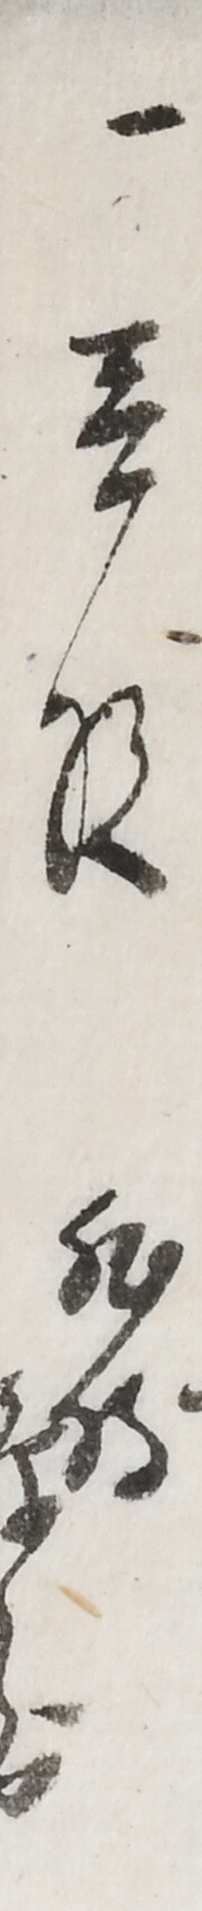一壱枚孫八
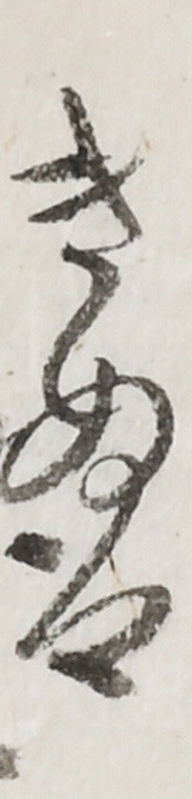きぬは
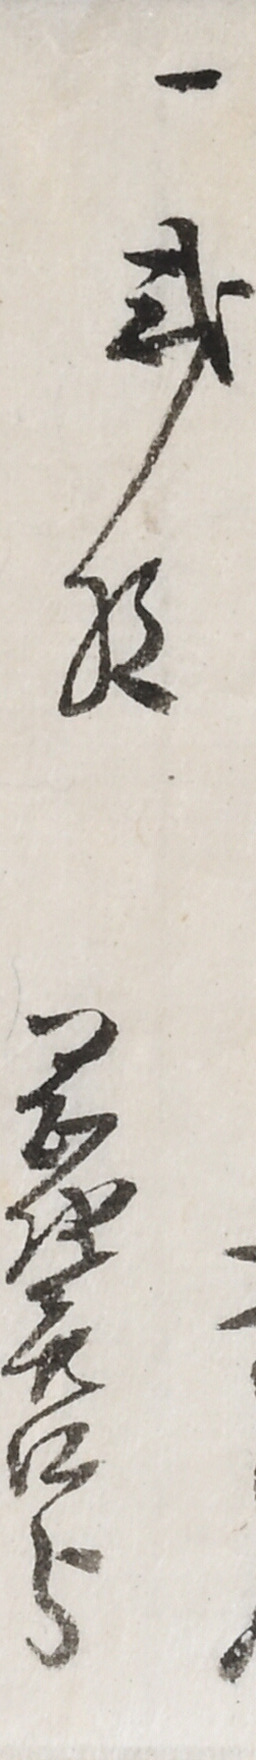一弐枚岡野喜四郎
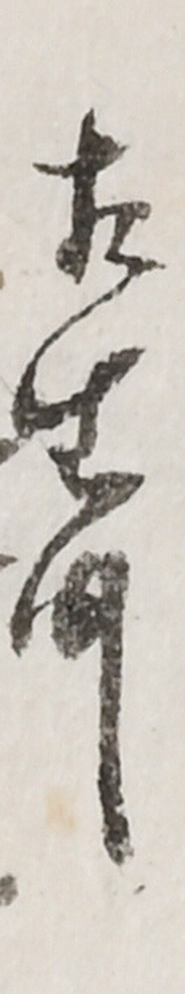相生町
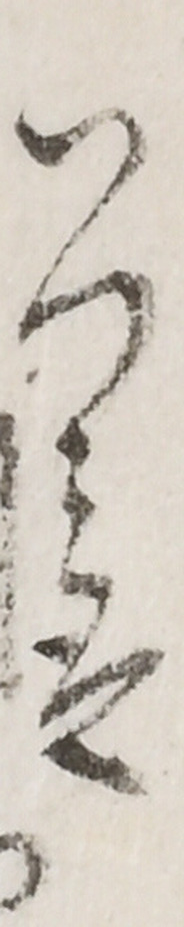いつみそ
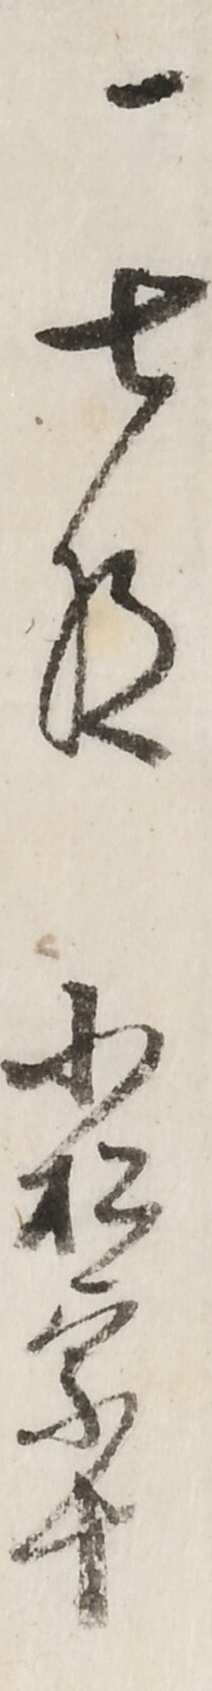一七枚小松宗十

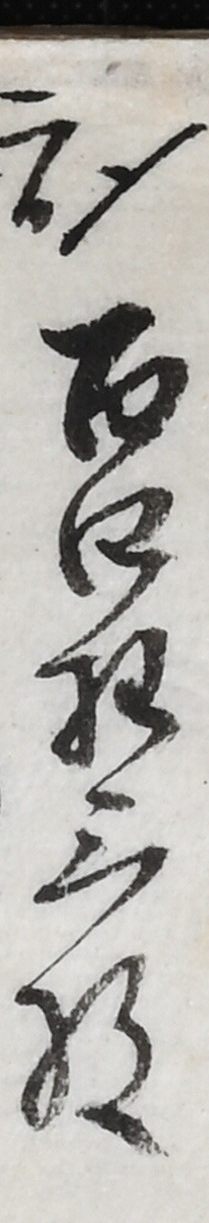〆百四拾三枚
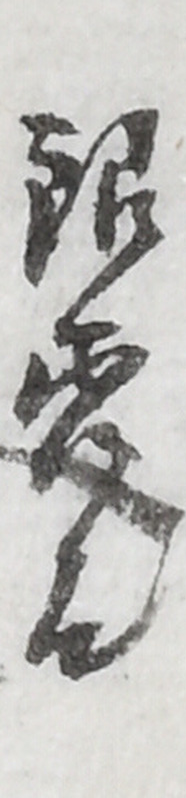銀杏屋
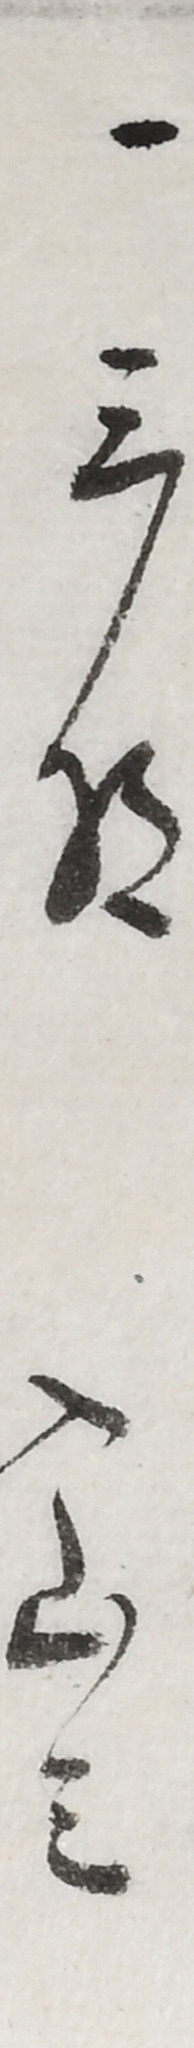一三枚入山三
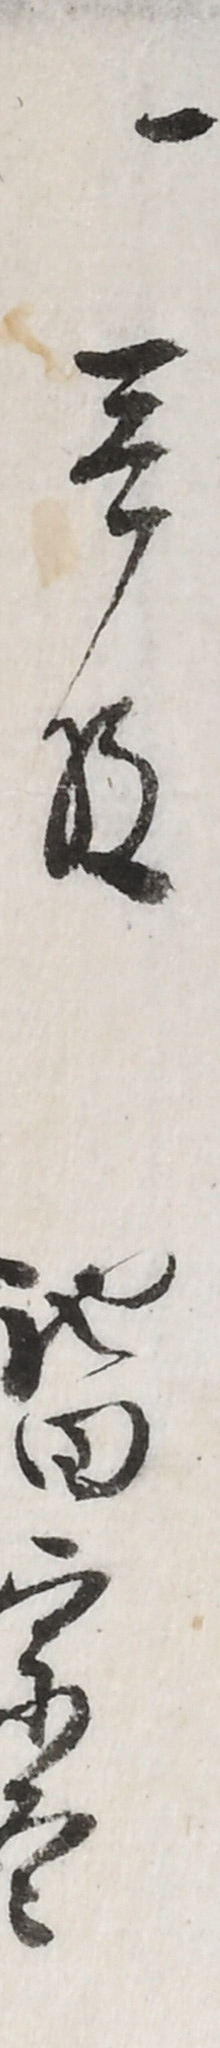一壱枚池田宗冬
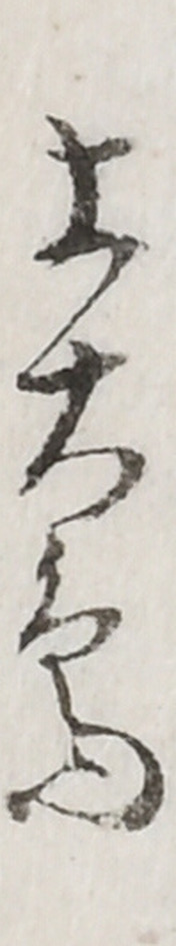上大島
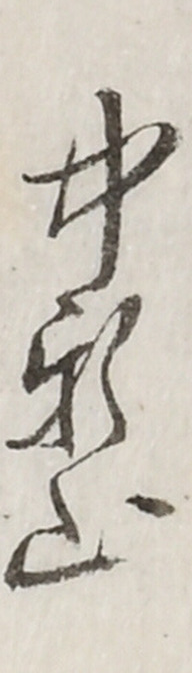中新山
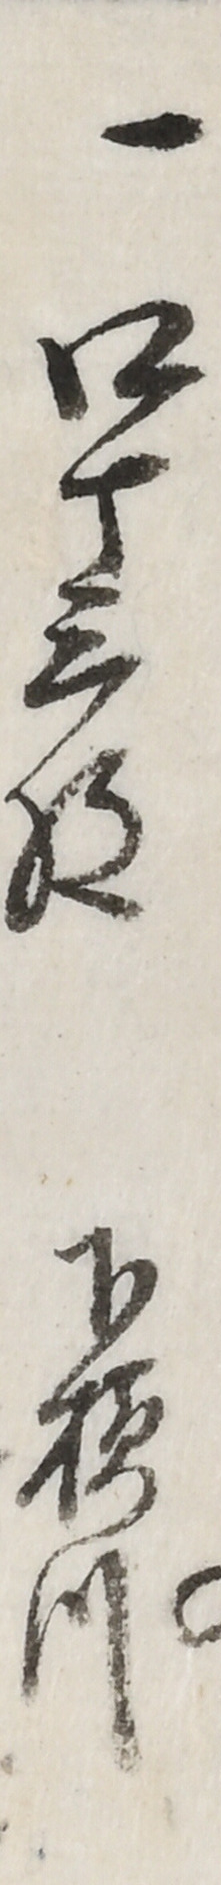一四十三枚太郎吉
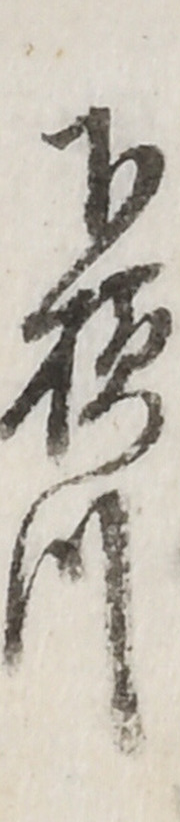下横川
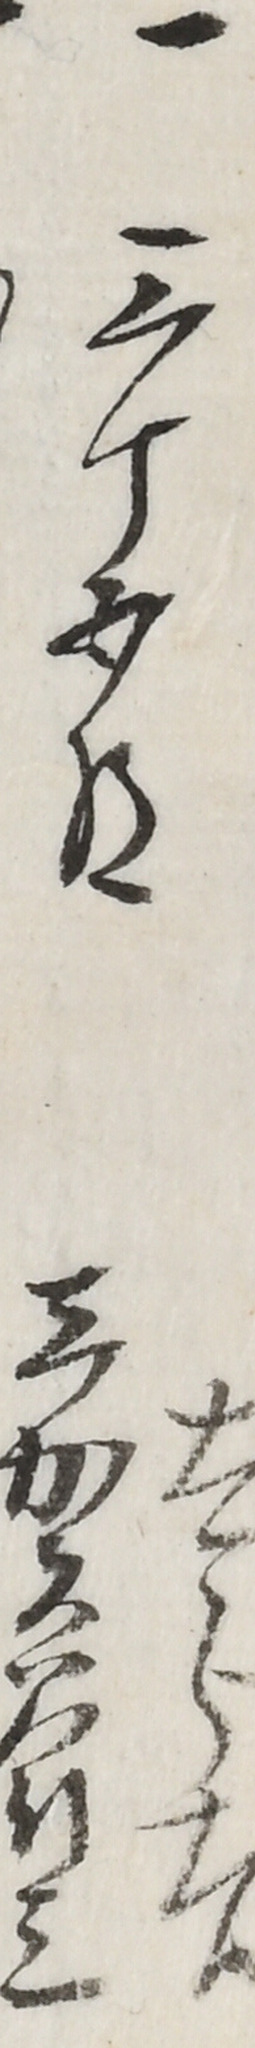一三十五枚加賀美谷利三
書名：髙遠限楮幣引換覚帳
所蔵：伊那市立高遠町図書館・合同会社AMANE
